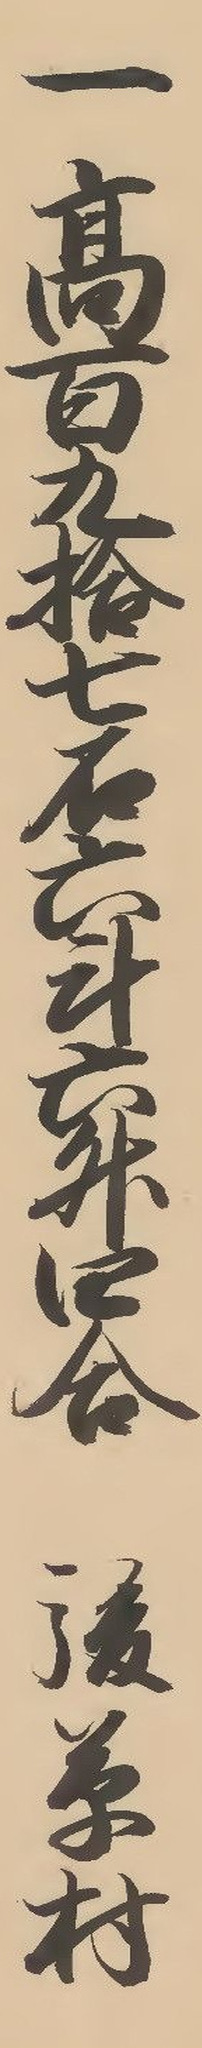一高百九拾七石六斗六升四合後草村
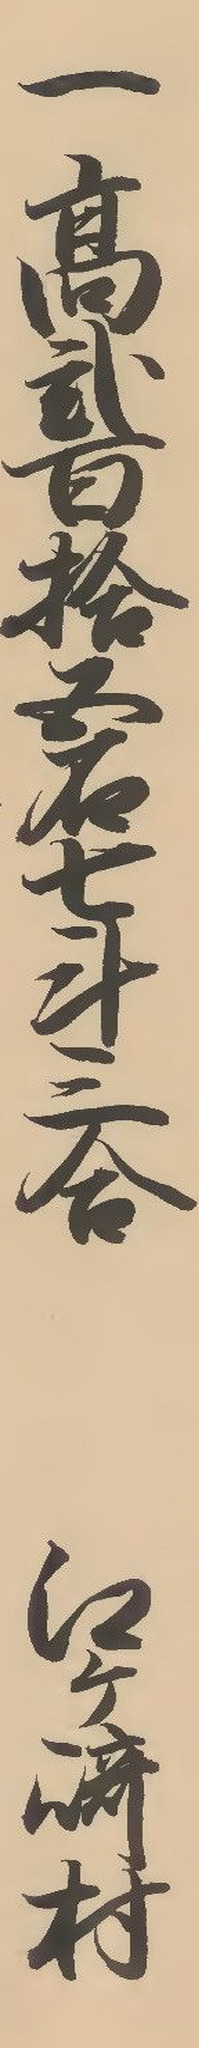一高弐百拾五石七斗三合江ヶ崎村
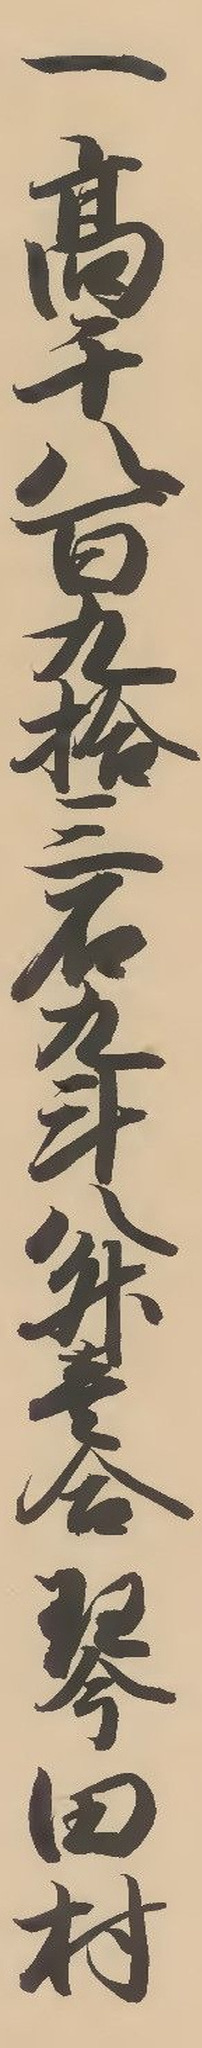一高千八百九拾三石九斗八升壱合琴田村
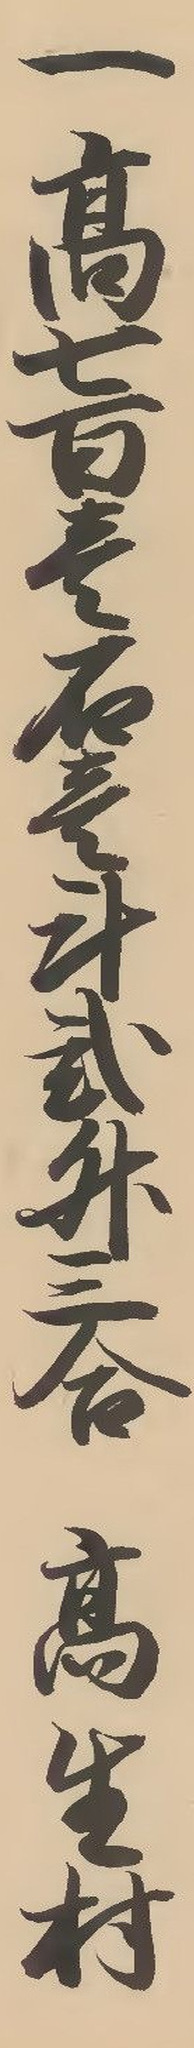一高七百壱石壱斗弐升三合高生村

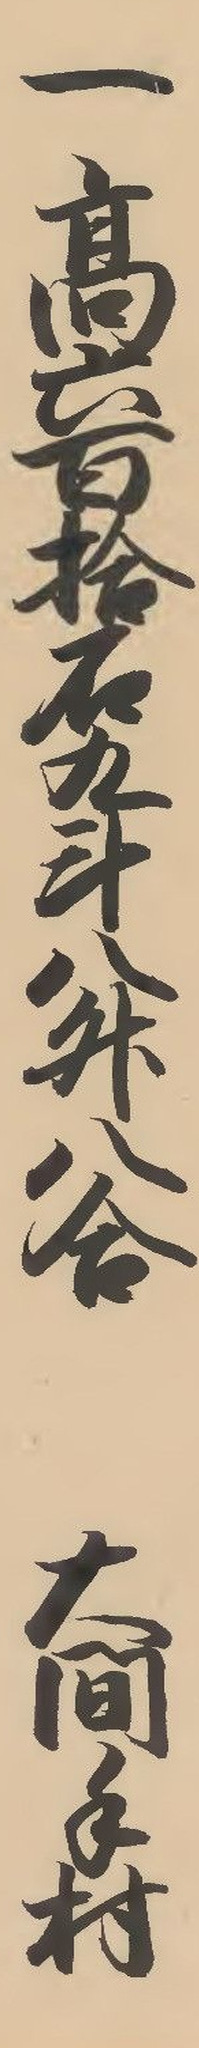一高六百拾石九斗八升八合大間手村
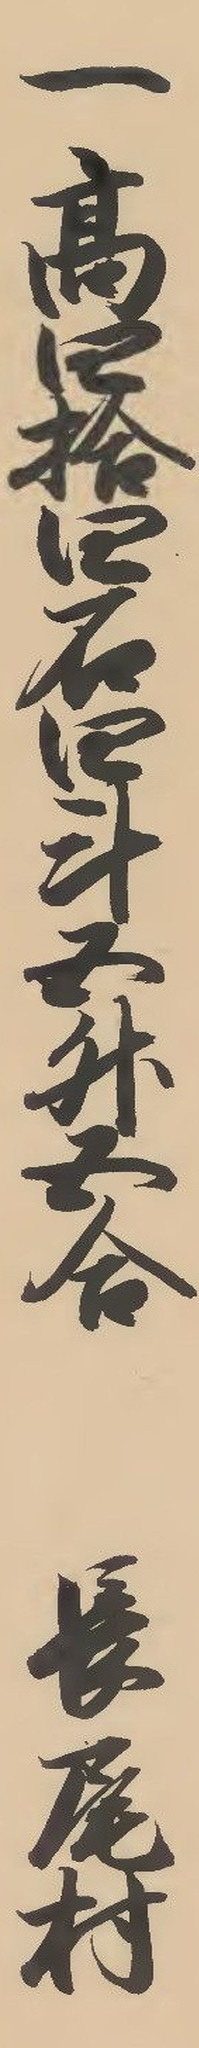一高四拾四石四斗五升五合長尾村
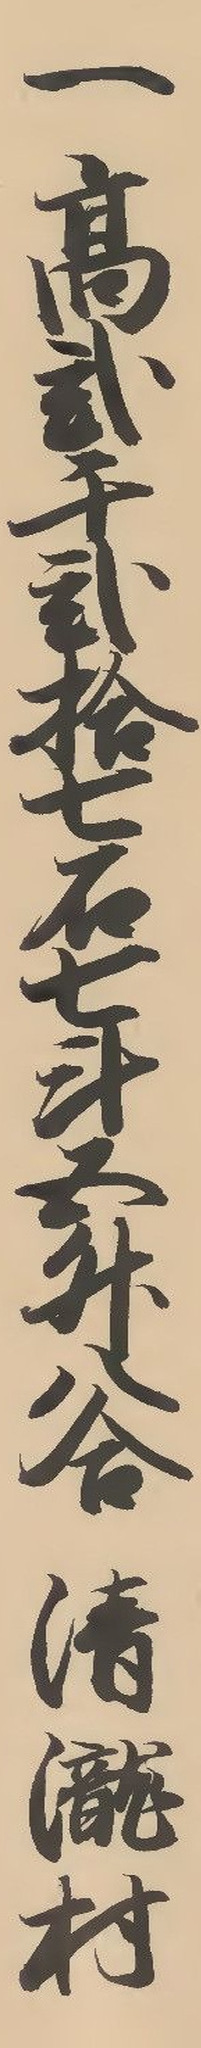一高弐千弐拾七石七斗五升八合清滝村
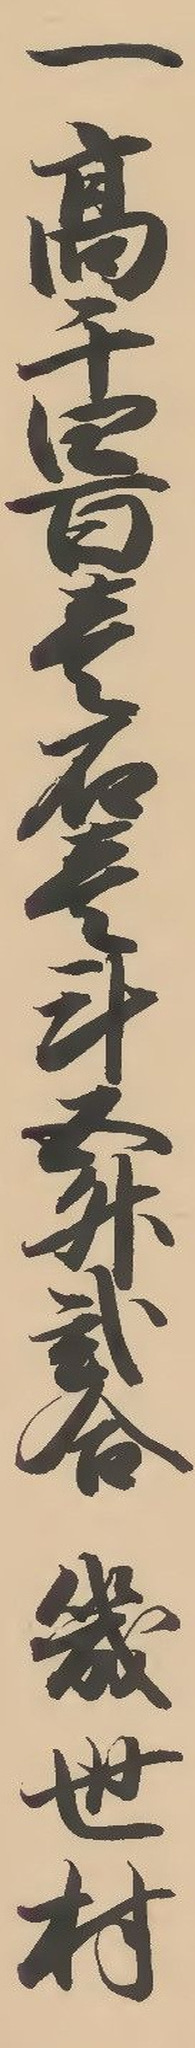一高千四百壱石壱斗五升弐合幾世村
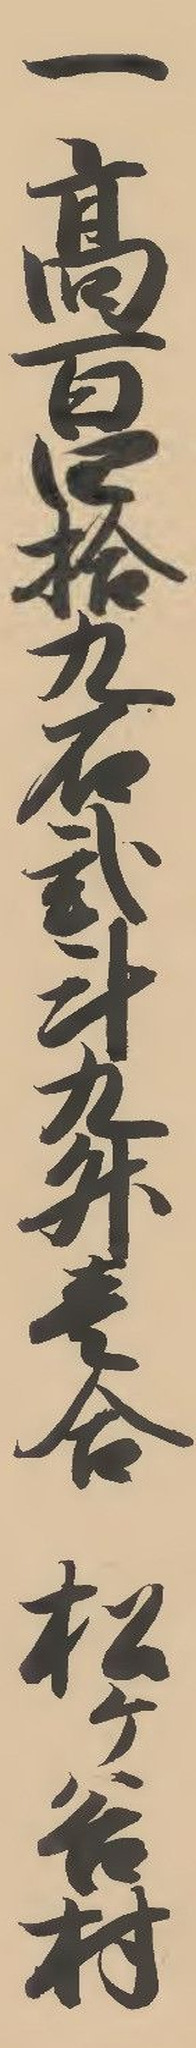一高百四拾九石弐斗九升壱合松ヶ谷村
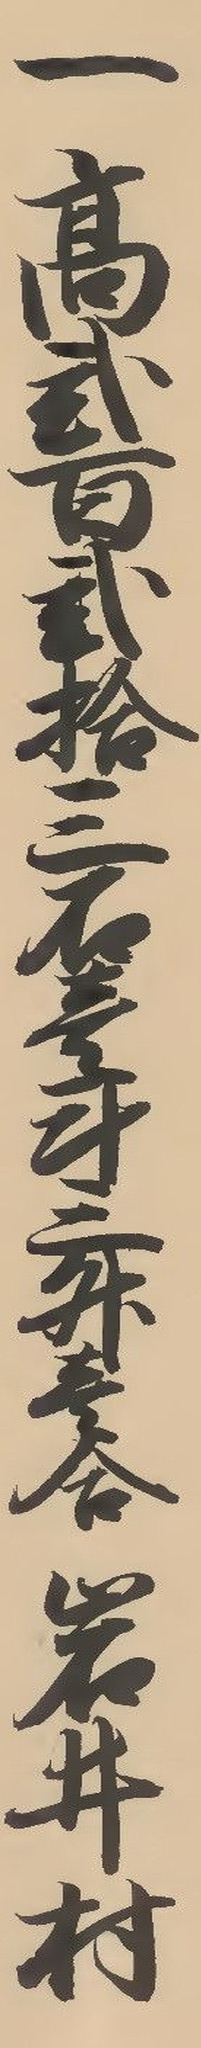一高弐百弐拾三石壱斗三升壱合岩井村
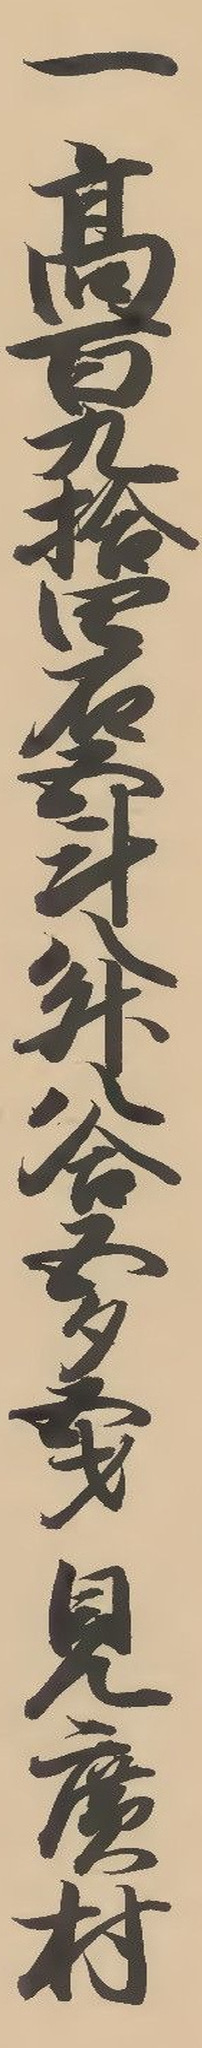一高百九拾四石五斗八升八合五勺五才見広村
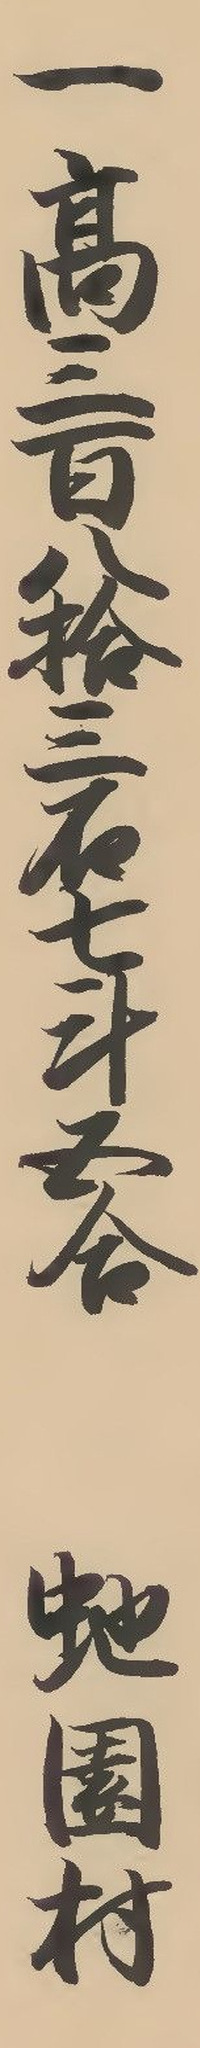一高三百八拾三石七斗五合蛇園村

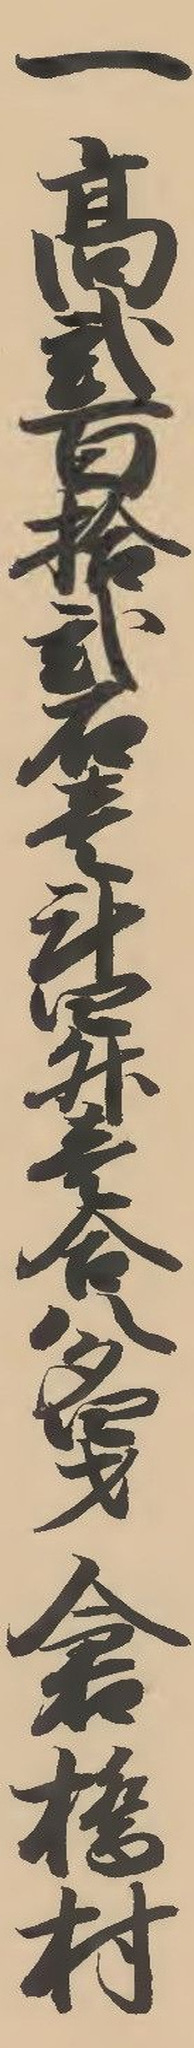一高弐百拾弐石壱斗四升壱合八勺四才倉橋村
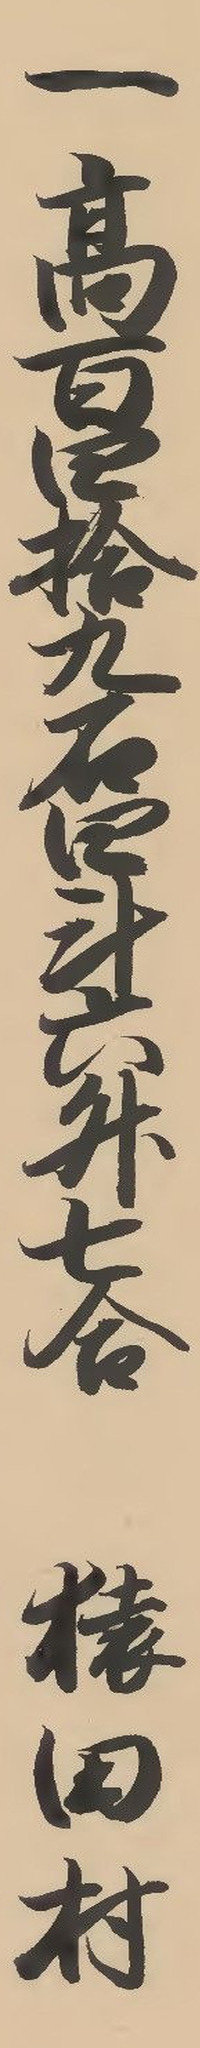一高百四拾九石四斗六升七合猿田村
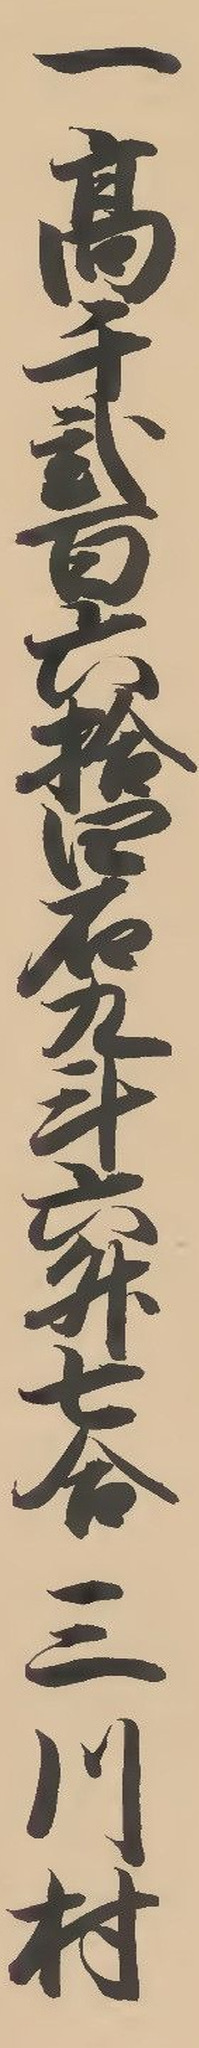一高千弐百六拾四石九斗六升七合三川村
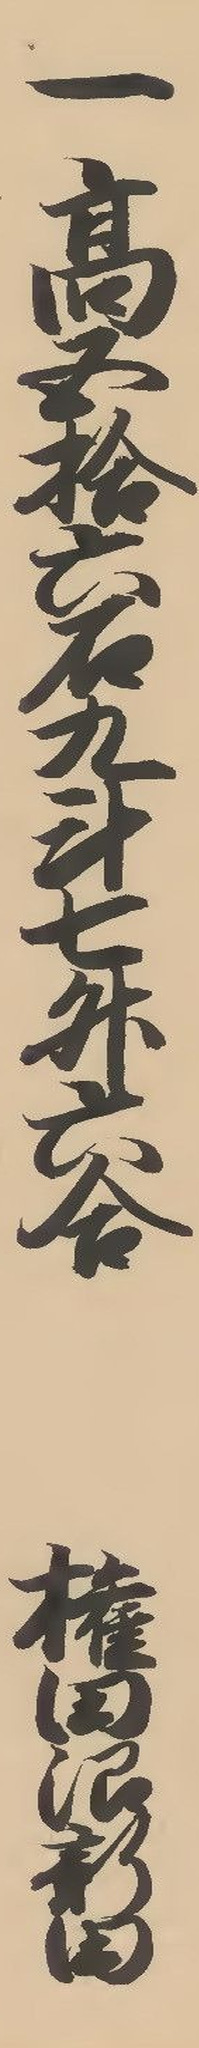一高五拾六石九斗七升六合権田沼新田
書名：下総国郷帳
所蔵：国立公文書館 National Archives of Japan
